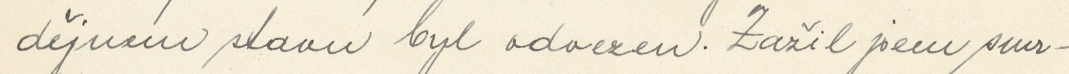dějném stavu byl odvezen. Zažil jsem smr-
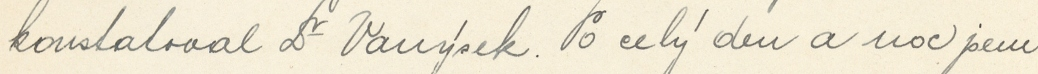konstatoval Dr Vanýsek. Po celý den a noc jsem
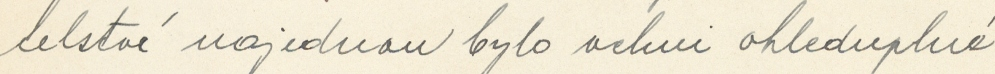telství najednou bylo velmi ohleduplné
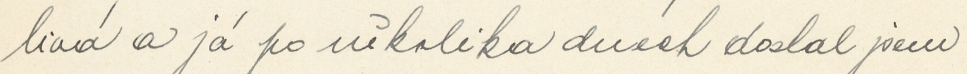livá a já po několika dnech dostal jsem
